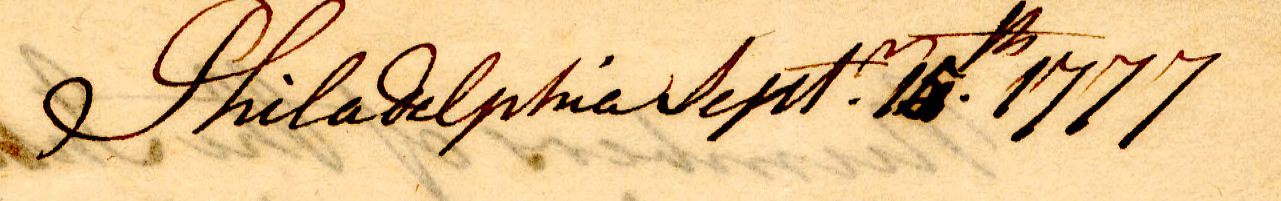Philadelphia Sept^r. 15^th. 1777
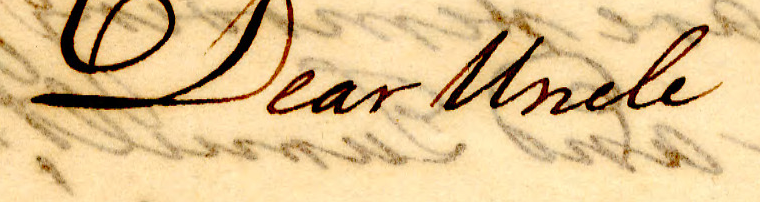Dear Uncle
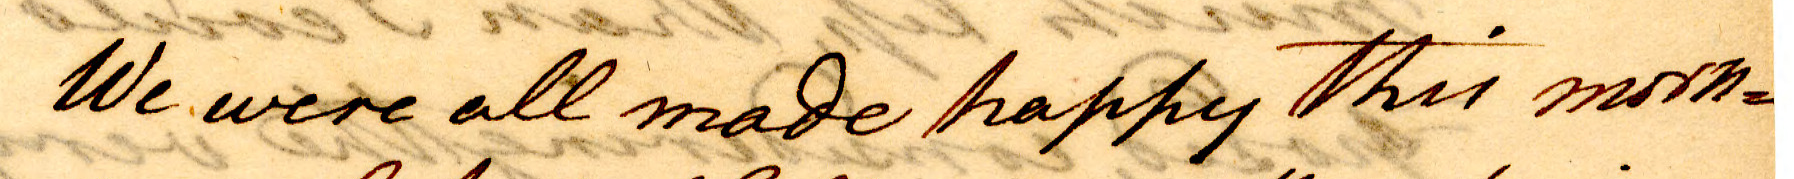We were all made happy this morn-
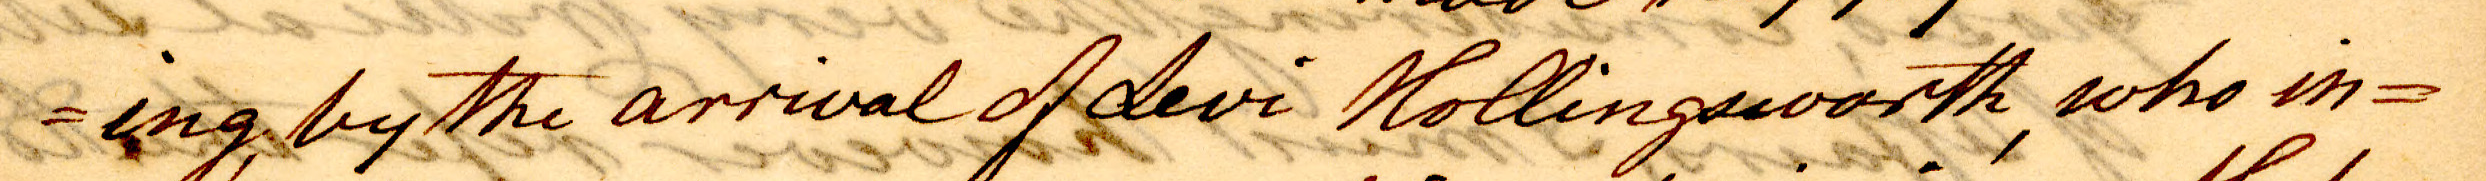-ing, by the arrival of Levi Hollingsworth, who in-
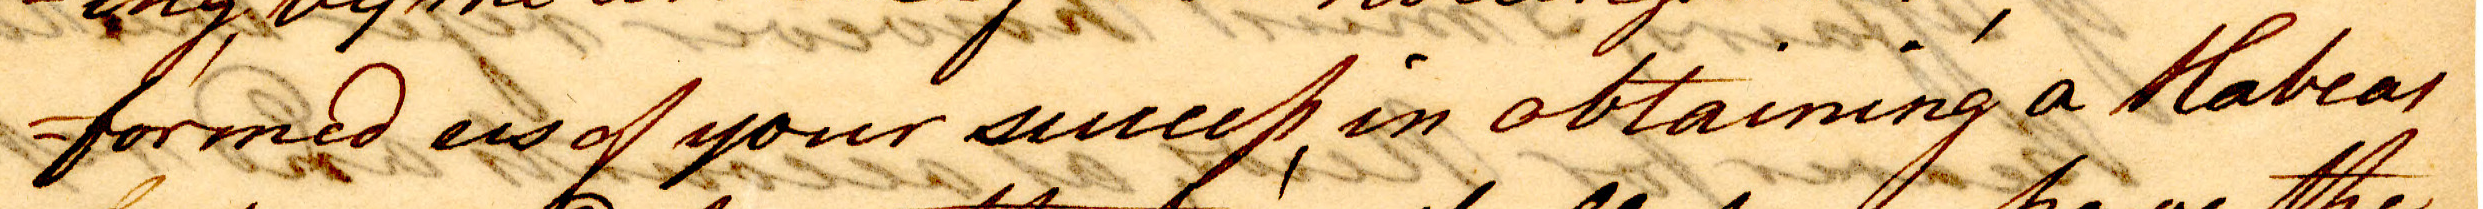-formed us of your success, in obtaining a Habeas
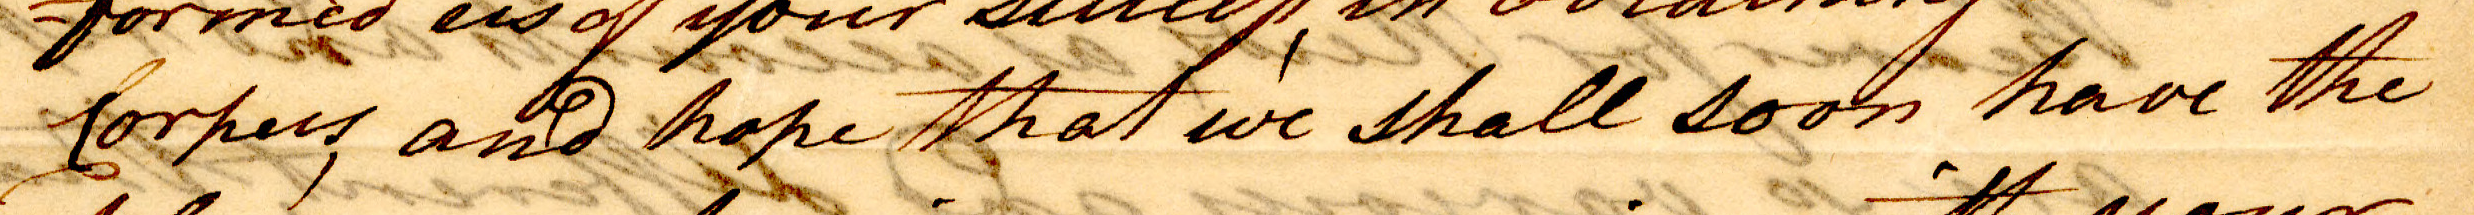Corpus, and hope that we shall soon have the
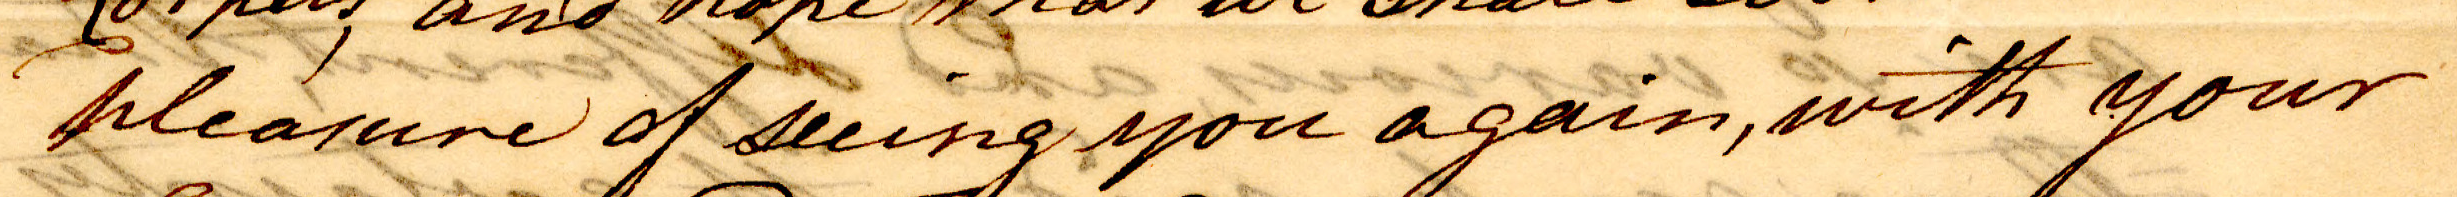pleasure of seeing you again, with your
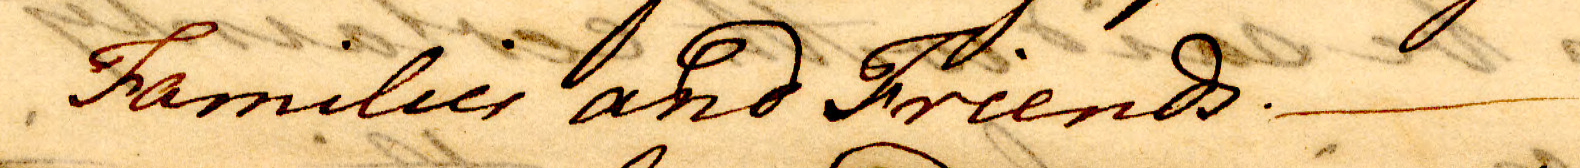Families and Friends.-
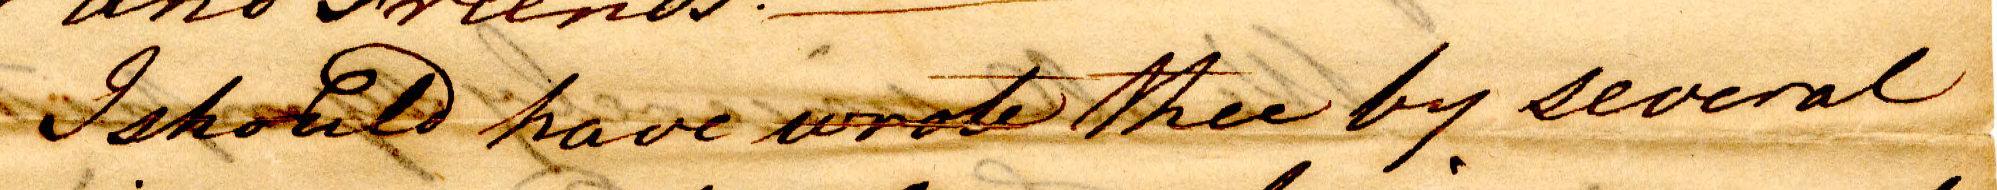I should have wrote thee by several
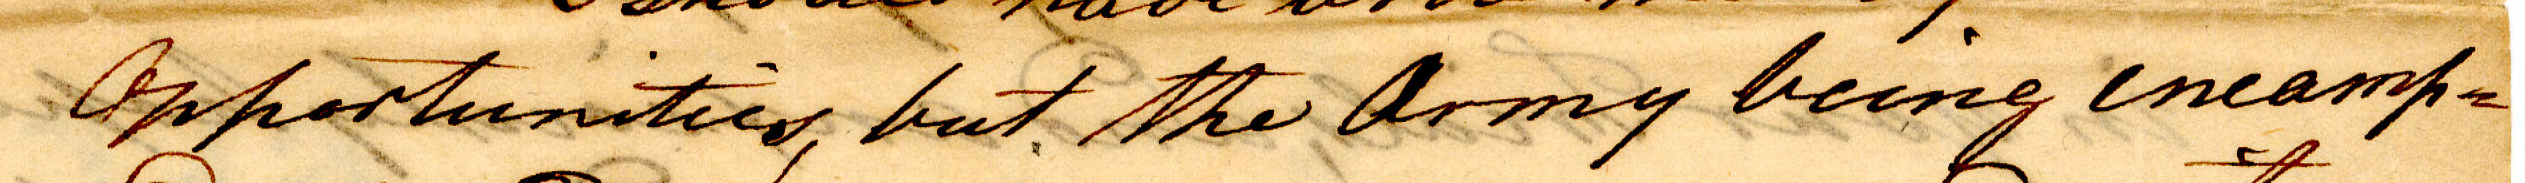Opportunities, but the Army being encamp-
